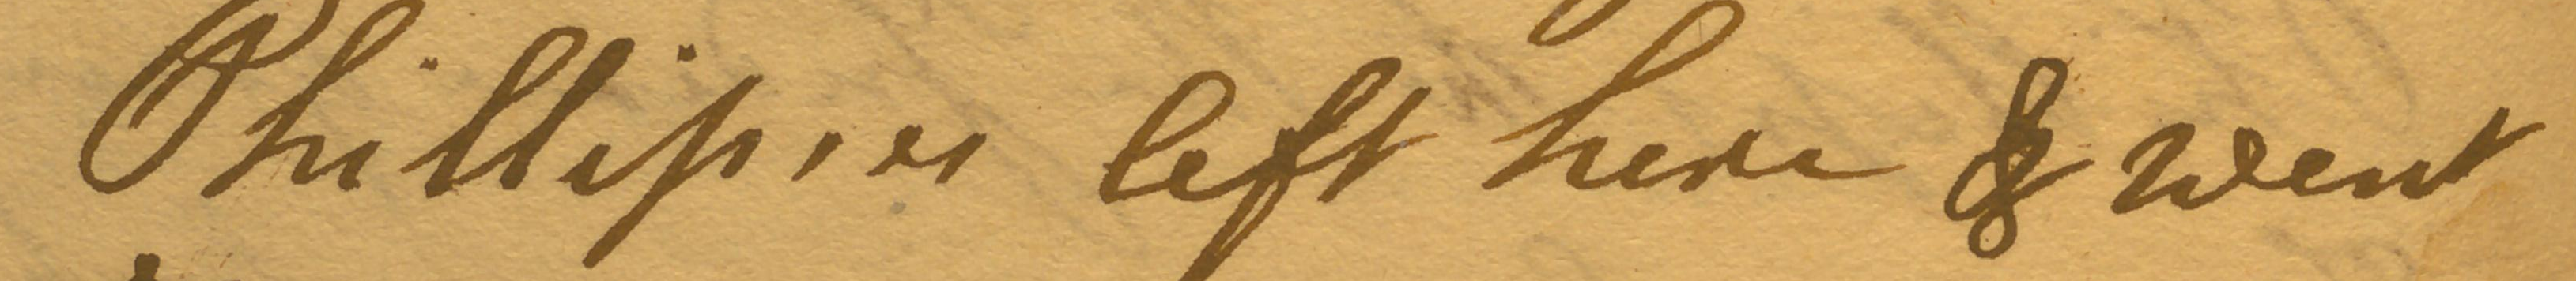Phillipses left here & went
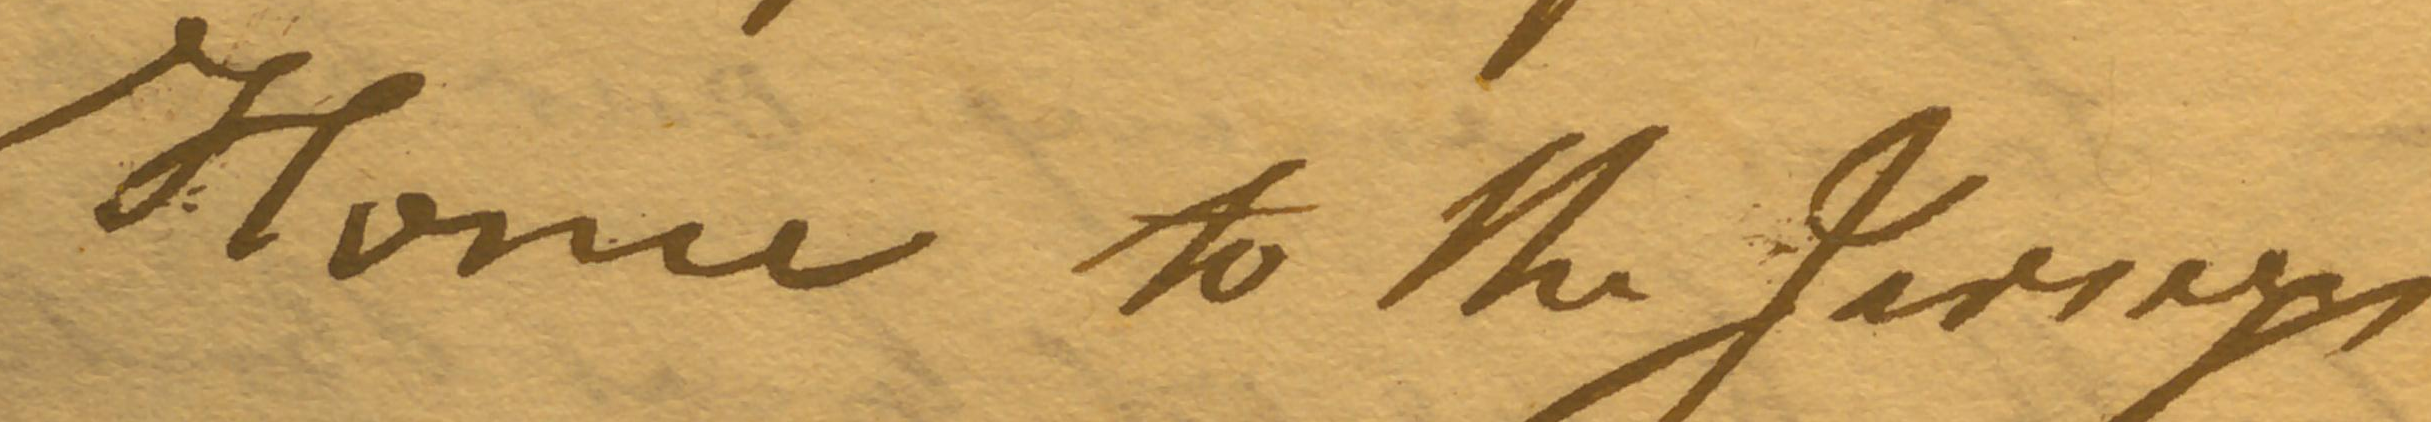Home to the Jerseys
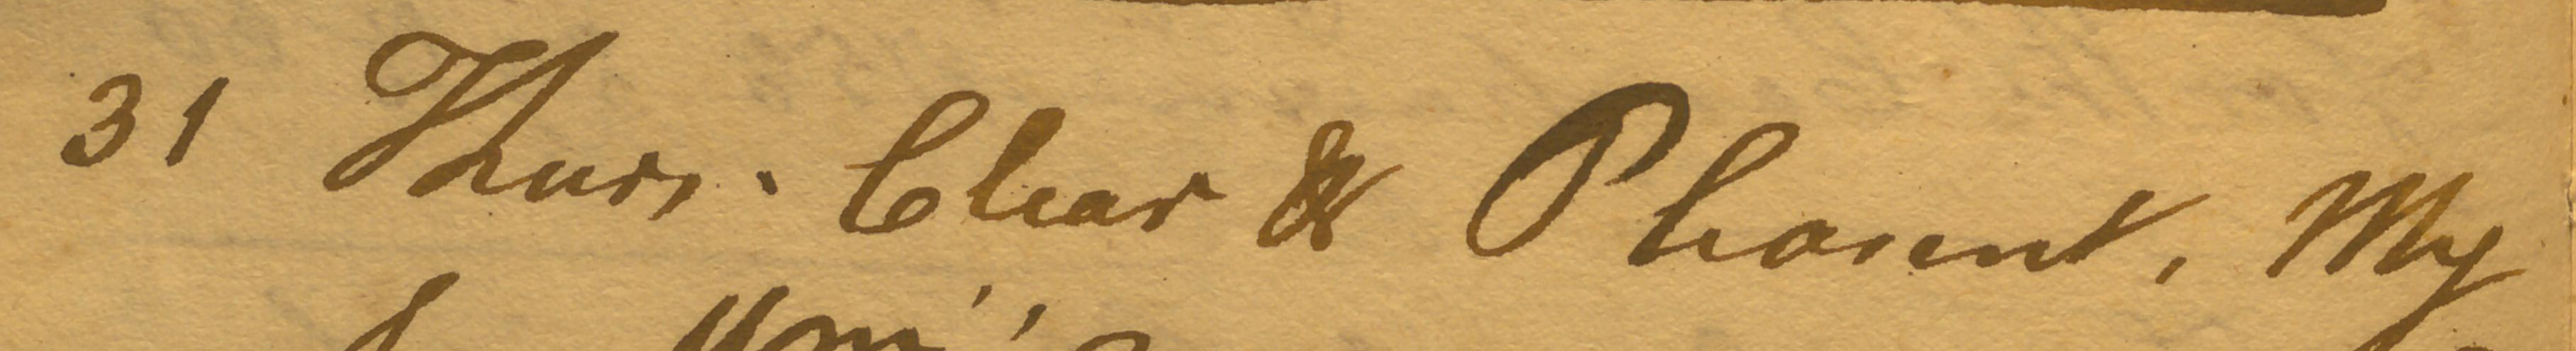31 Thurs. Clear & Pleasent. My
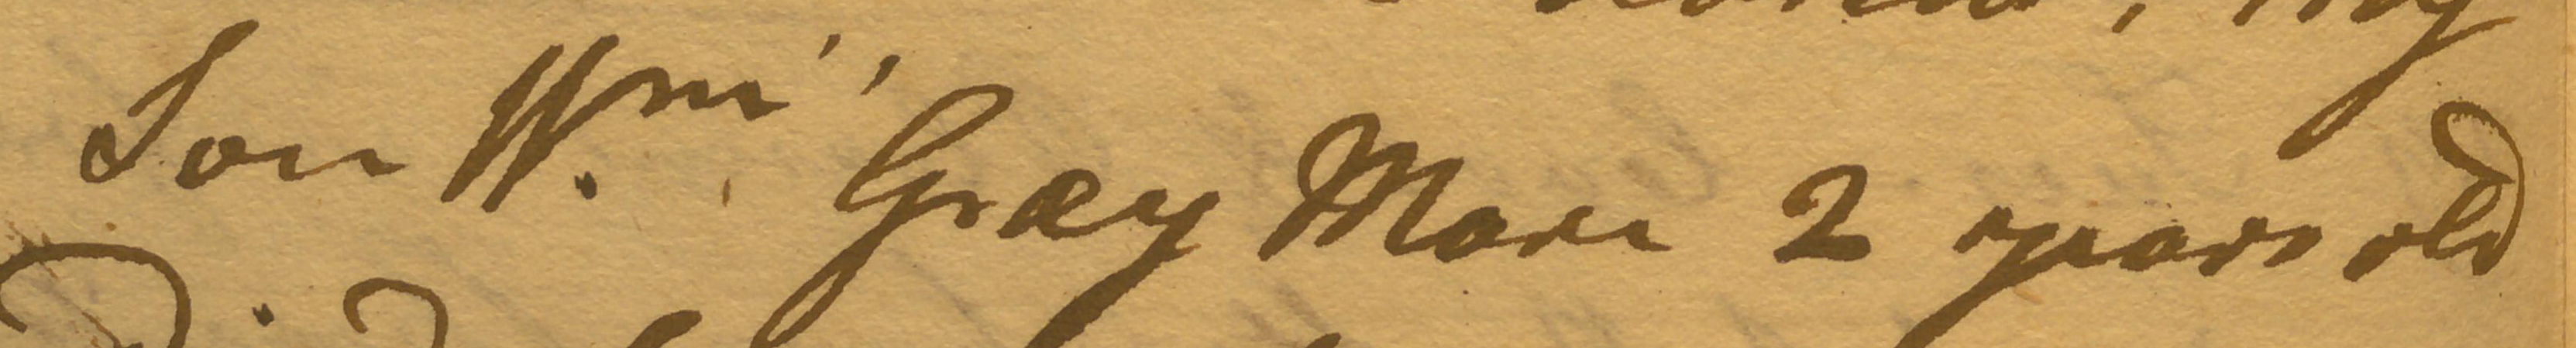Son W^m. Gray Mare 2 years old
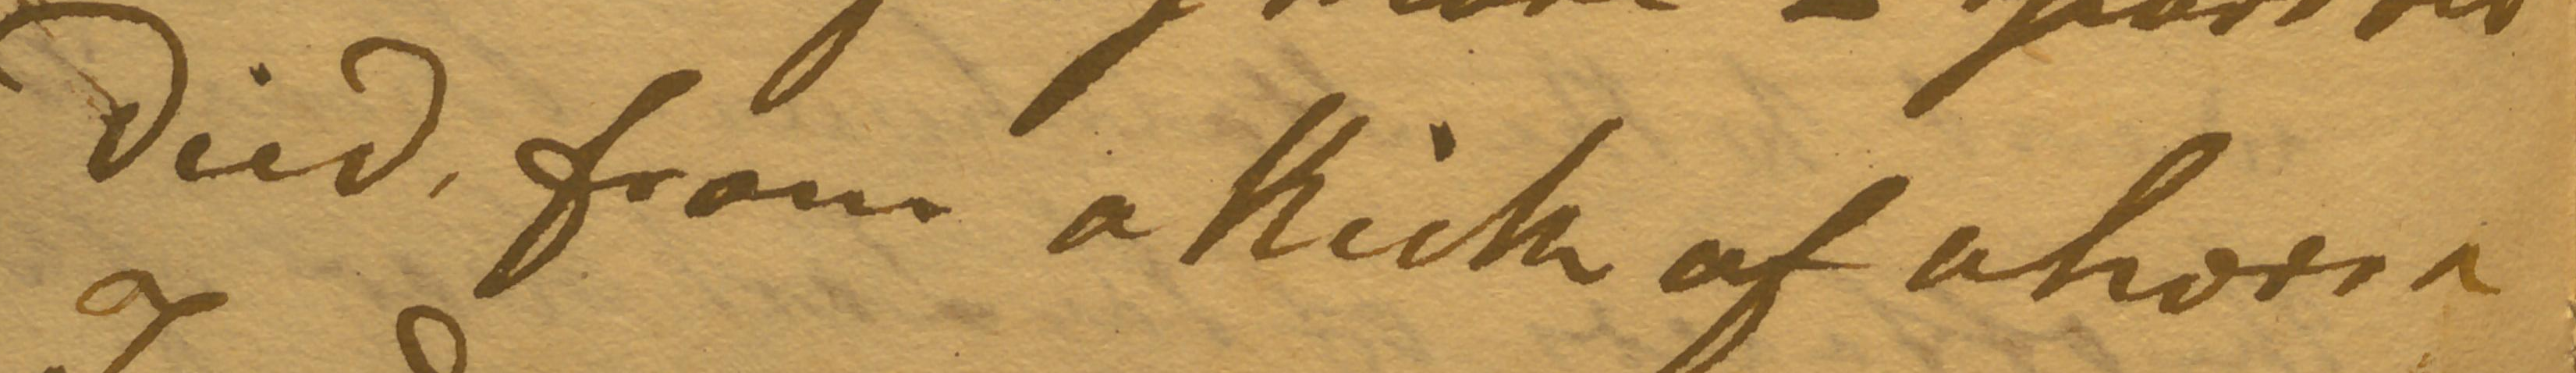died, from a Kick of a horse
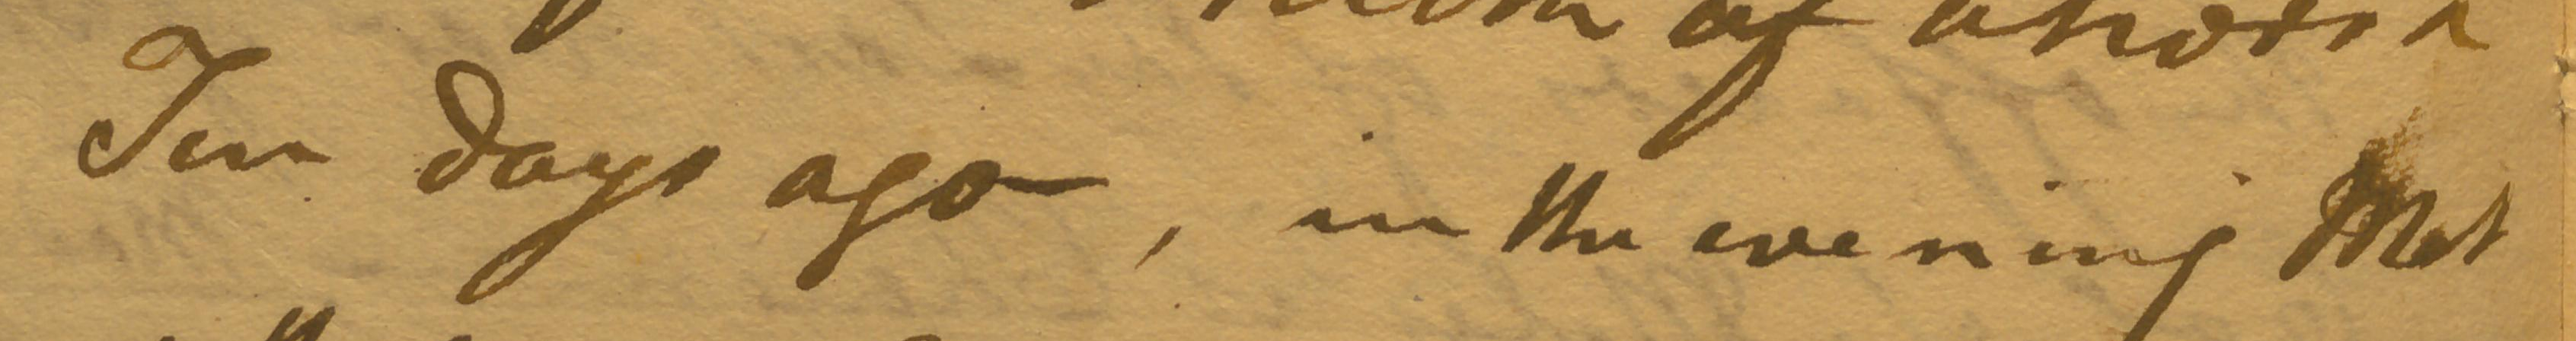Ten days ago, in the evening Met
